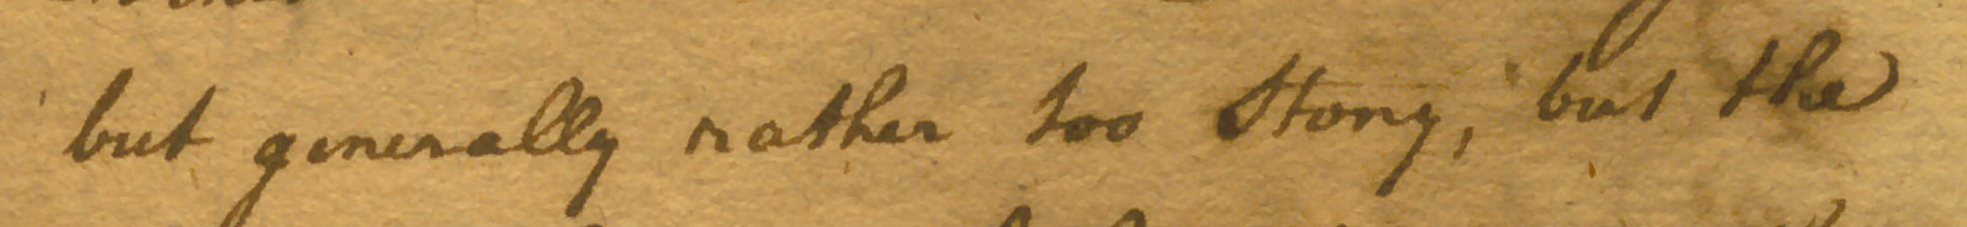but generally rather too Stony, but the
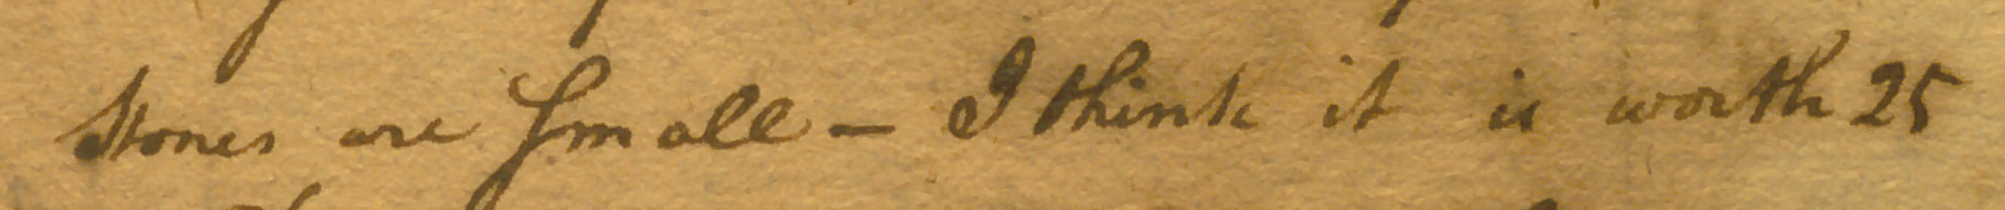Stones are small- I think it is worth 25
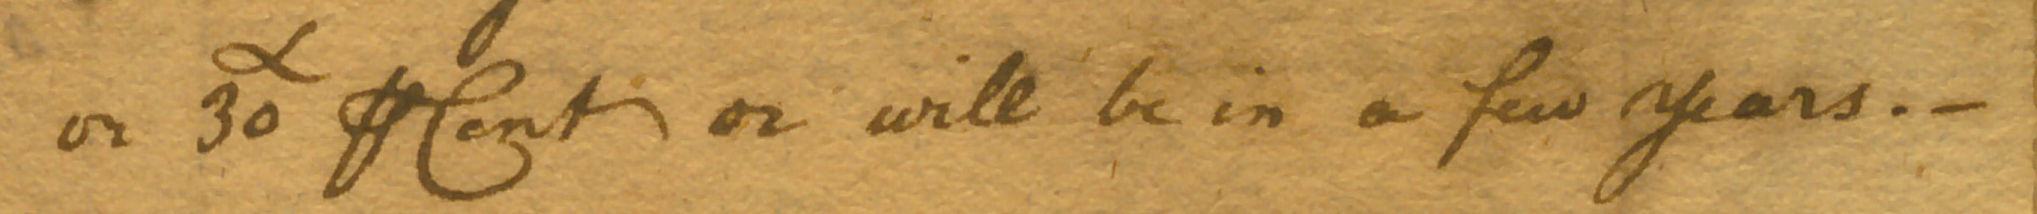or 30 perCent or will be in a few years.-
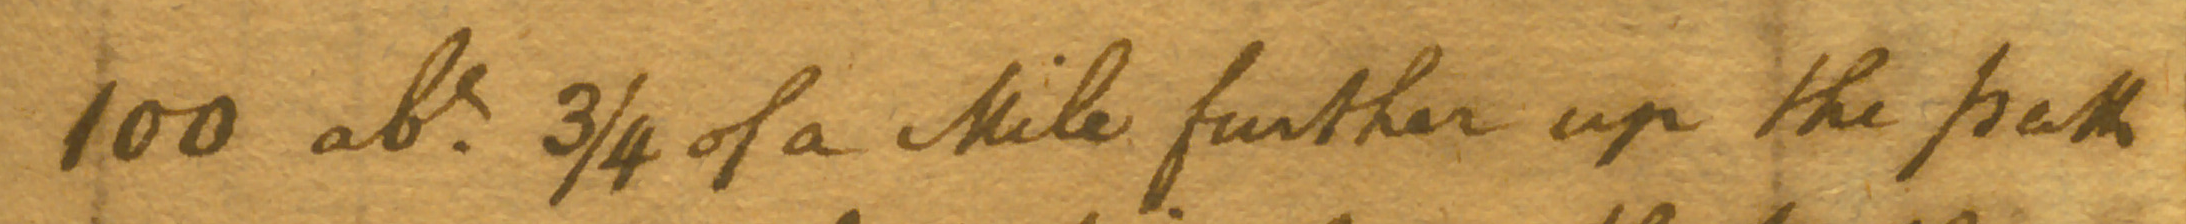100 ab^t. 3/4 of a Mile further up the path
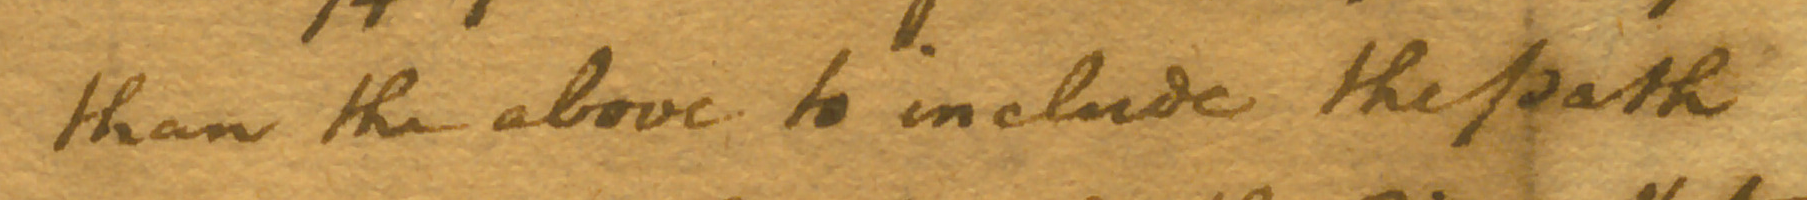than the above to include the path
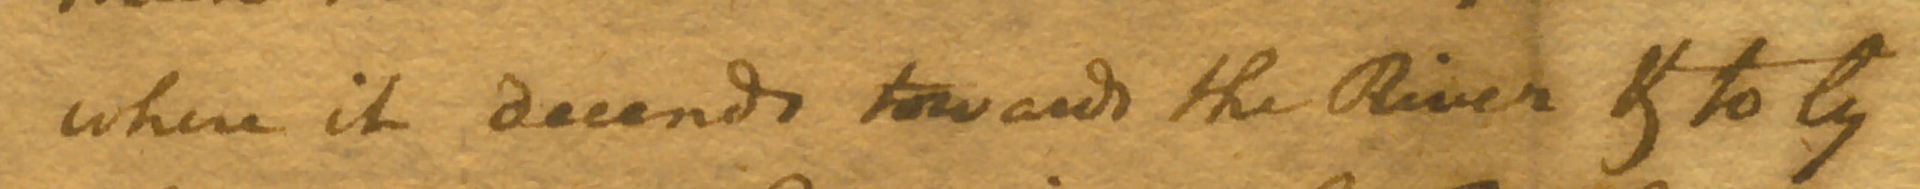where it decends towards the River & to ly
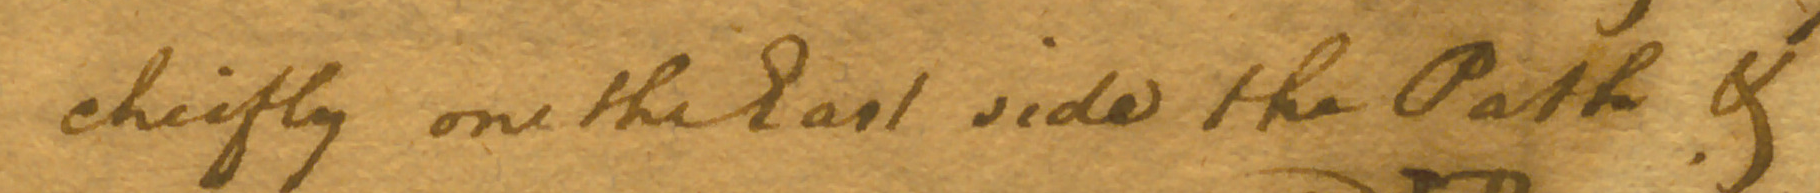chiefly on the East side the Path &
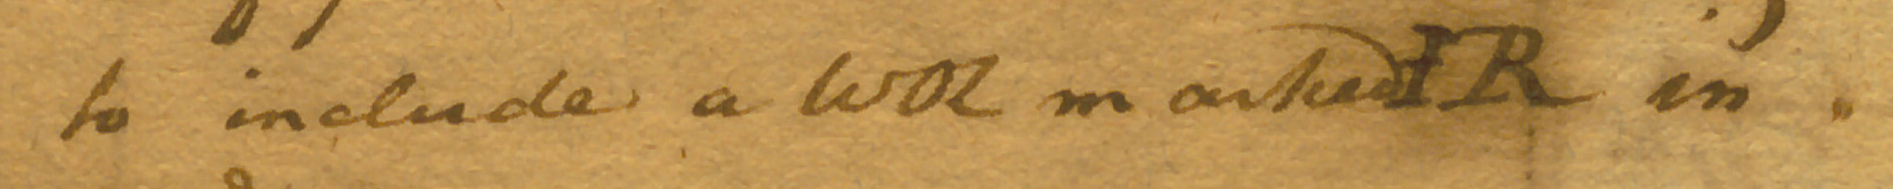to include a W 0h marked IR in
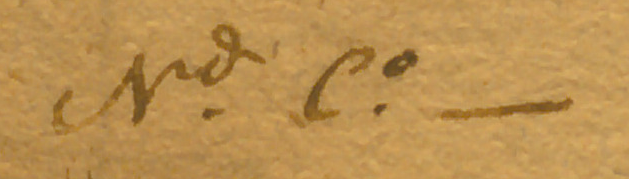N^d. C^o.-
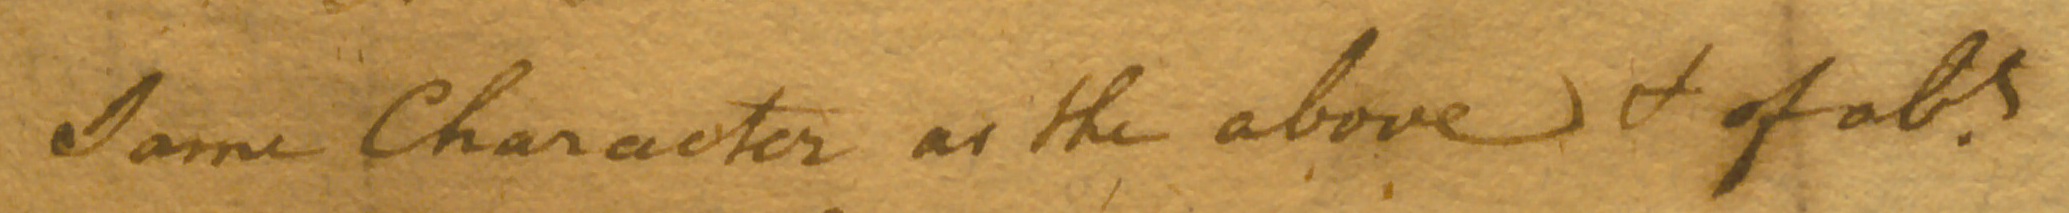Same Character as the above & of ab^t.
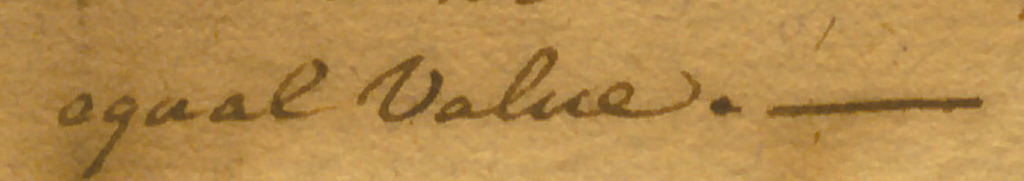equal Value.-
